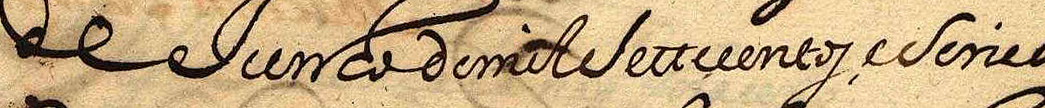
de Iunho de mil Settecentos, e Sinco
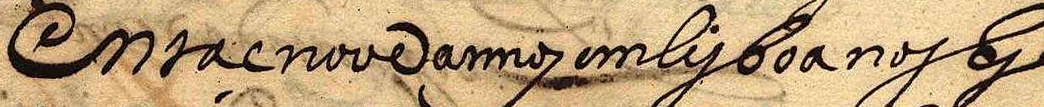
enta e nove annos em lisboa nos Es
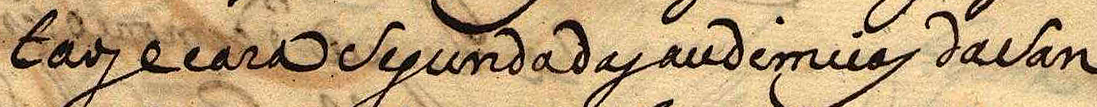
taos e caza segunda das audimcias da san
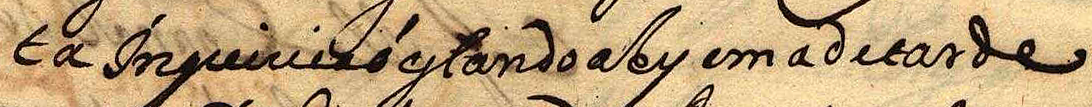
ta Inquizicaõ estando ahy em a de tarde
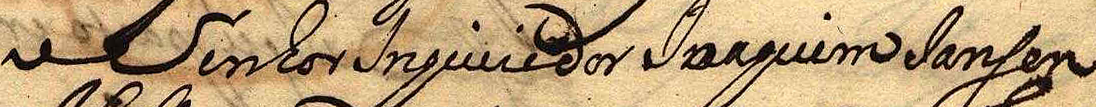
o Senhor Inquizidor Ioaquim Iansen
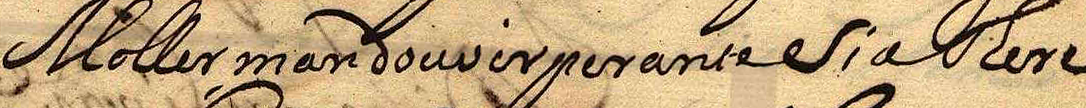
Moller, mandou vir perante Si a There
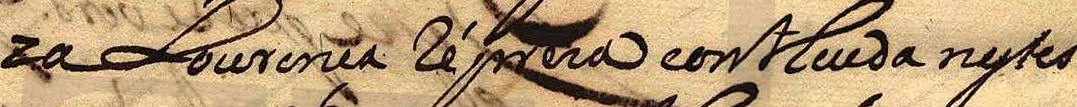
za Lourença Ré preza contheuda nestes
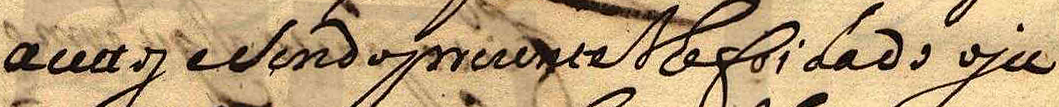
auttos, e sendo prezente lhe foi dado o ju
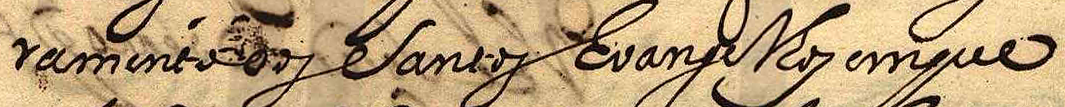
ramento aos Santos Evangelhos em que
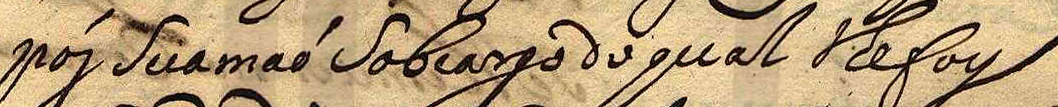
pós Sua maõ Sob cargo do qual lhe foy
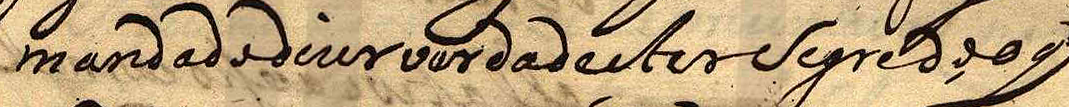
mandado dizer verdade ter Segredo, o q̄
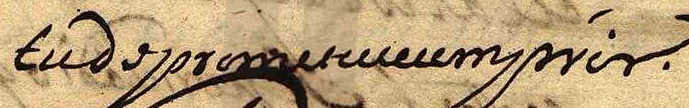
tudo prometeu cumprir.
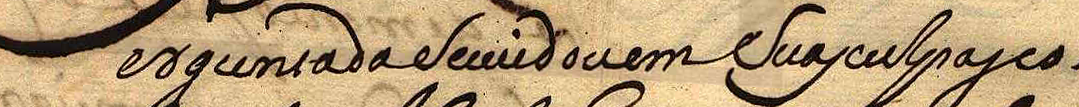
Perguntada Se cuidou em Suas culpas co
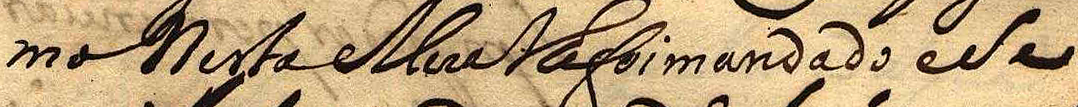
mo Nesta Meza lhe foi mandado, e Se
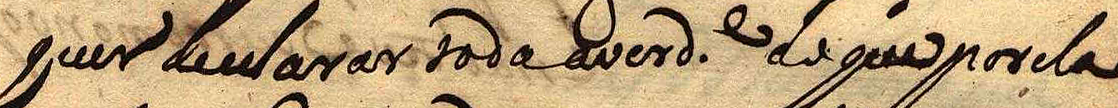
quer declarar toda a verd.e do que por ela
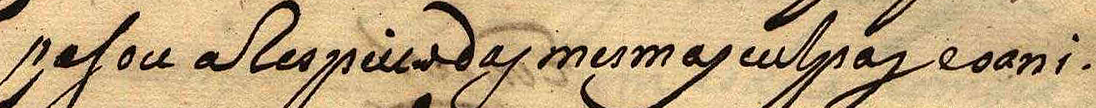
pasou a Respeito das mesmas culpas e o ani
